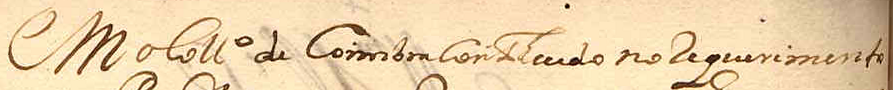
EM o Collo de Coimbra contheudo no Requerimento
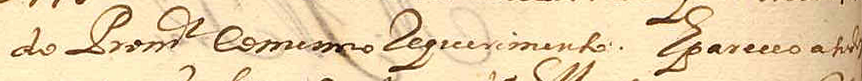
do Promor e o mesmo Requerimento. E pareceo a todos
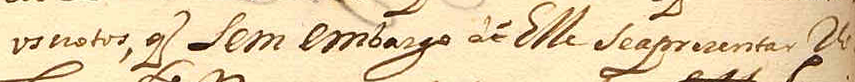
os uotos, q̄ Sem embargo de elle se aprezentar Vo
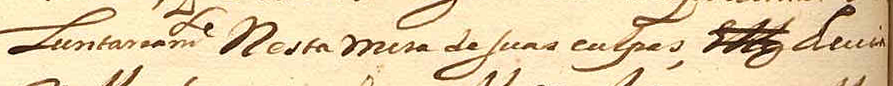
Luntariamte Nesta mesa de suas culpas, Ell_ deuia
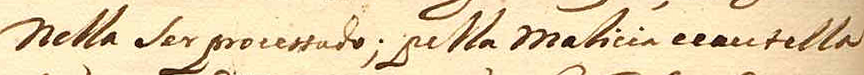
Nella ser processado; pella malicia e cautella
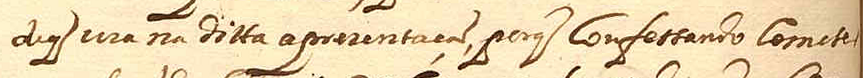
de q̄ uza na ditta aprezentaçaõ, porq̄ Confessando Cometer
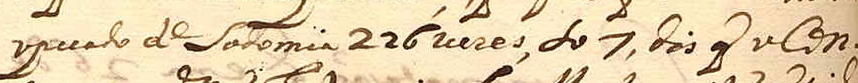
o pecado de Sodomia 226 uezes, so 7, dis q̄ o Con
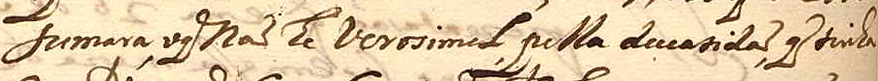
sumara, o q̄ Naõ he Verosimel, pella deuasidā, q̄ tinha
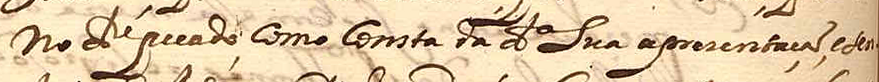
no do pecado, como consta da d̄a Sua aprezentaçaõ, e sen
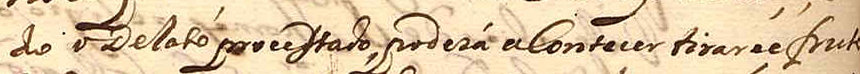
do o Delato processado, poderá aContecer tirarce fruto
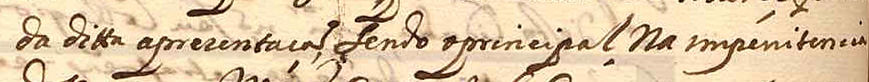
da ditta aprezentaçaõ, sendo o principal, Na impenitencia
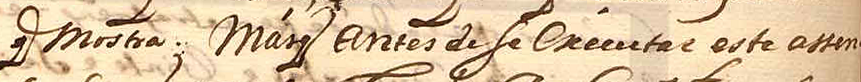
q̄ mostra; Mas q̄ antes de se executar este assen
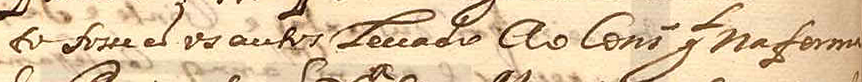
to fosse cō os autos Leuado Ao Conso gl na forma
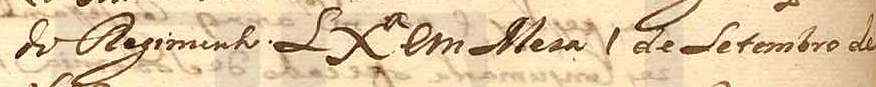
do Regimento. LXa em Meza 1 de Setembro de
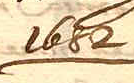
1682
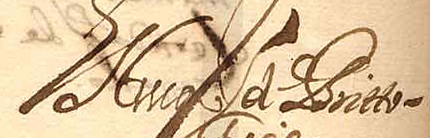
Esteuaõ de Britto -
